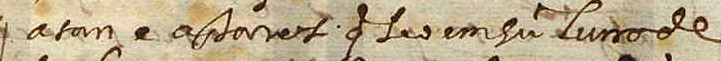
atan, e astarot q̄ leo em hū liuro de
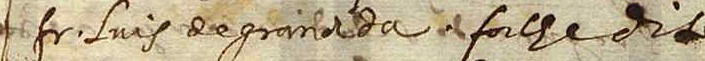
fr. Luis de granada. foilhe dito
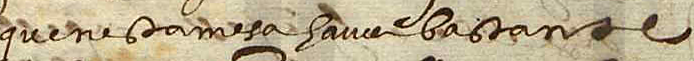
que nesta mesa hauia bastante
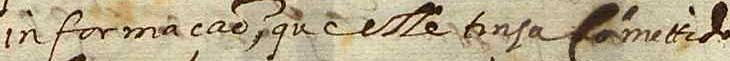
informaçaõ, que elle tinha Comettido
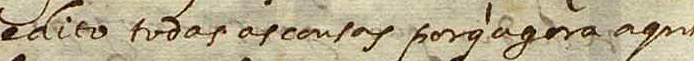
e dito todas as cousas por q̄ agora aqui
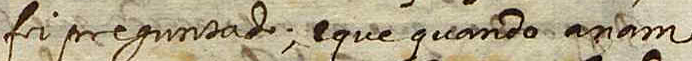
foi preguntado; e que quando a nam
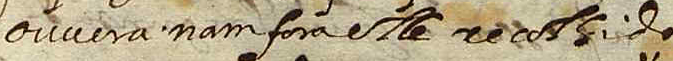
ouuera. nam fora elle recolhido
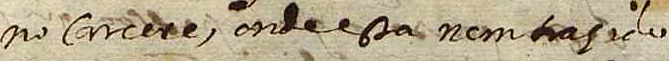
no carcere, onde esta nem trazido
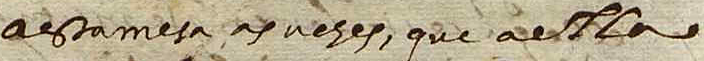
a esta mesa as uezes, que a ella
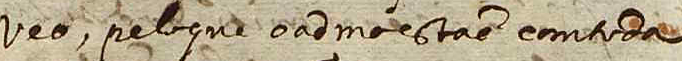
veo, pelo que o admoestaõ com toda
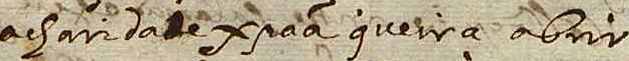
a charidade xpaā queira abrir
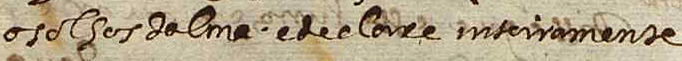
os olhos dalma. e declare inteiramente
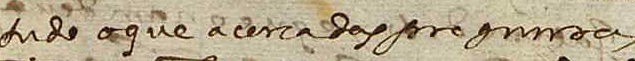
tudo o que acerca das preguntas
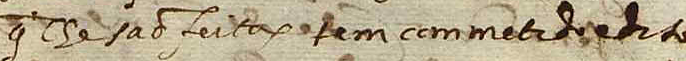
q̄ lhe saõ feitas tem commetido e dito
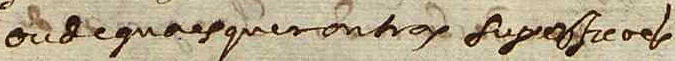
ou de quaesquer outras superstiçoẽs
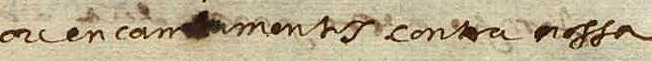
ou encan_amentos contra nossa
